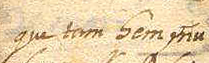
que tambem mu
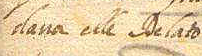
daua elle Delato
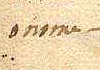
o nome
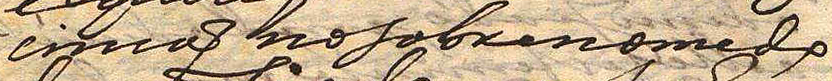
criuaõ no sobrenome do
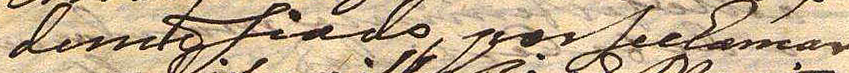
denūsiado, por se chamar
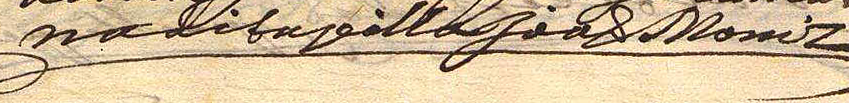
na dita villa Joaõ Moniz
